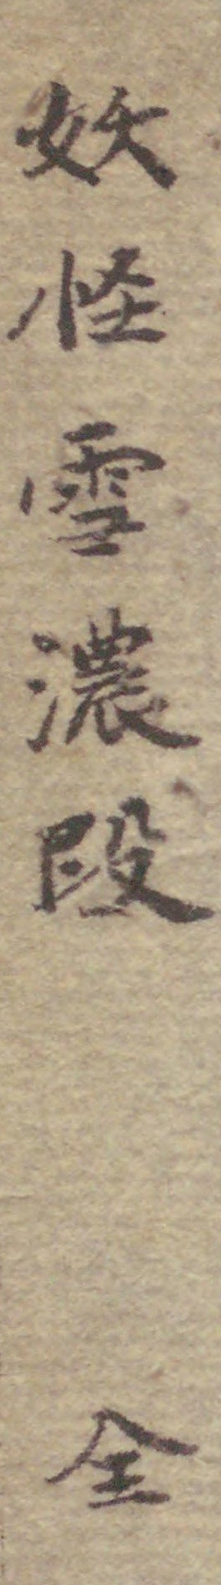妖怪雪濃段全

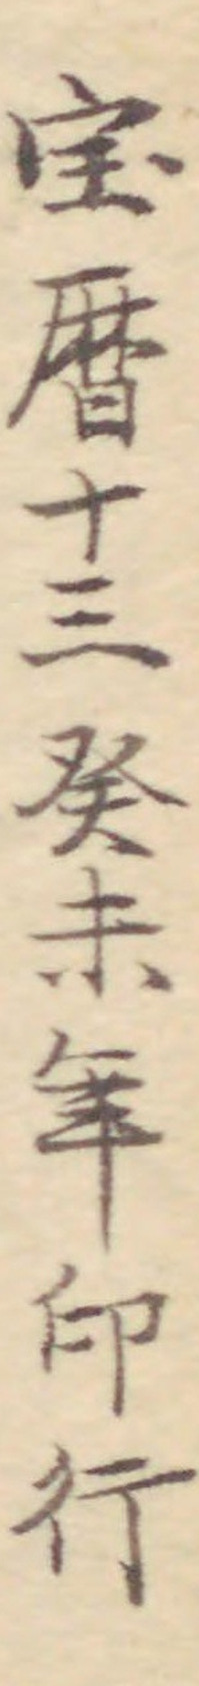宝暦十三癸未年印行
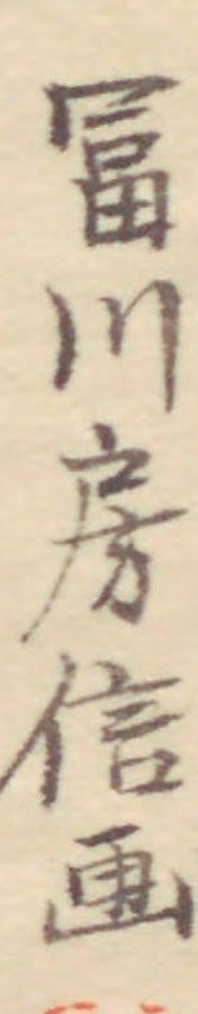富川房信画
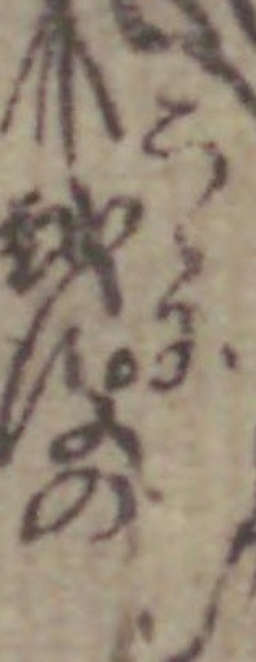越後の
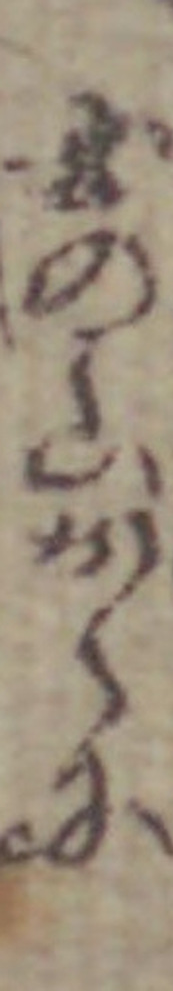国の山おくに
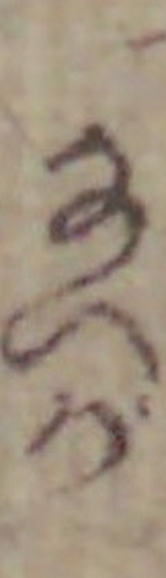ないか
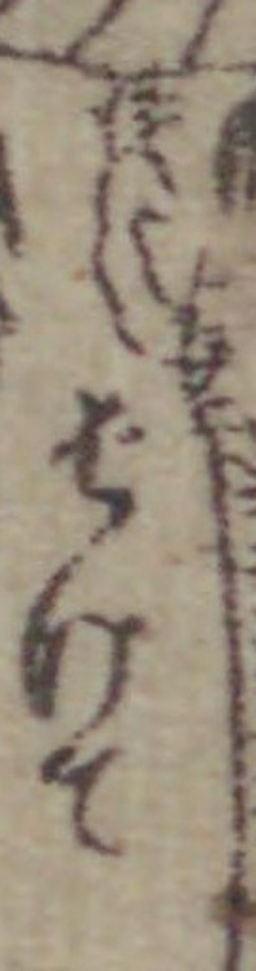ばけて
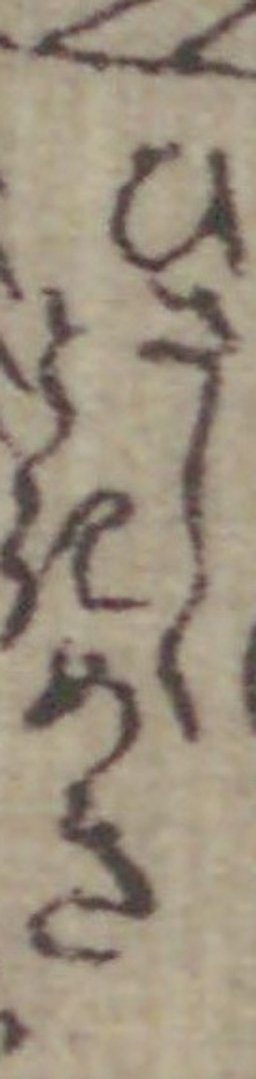ときめき
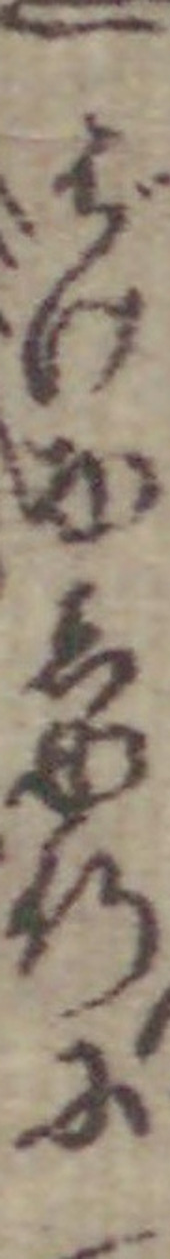ばけ物しゆ行に
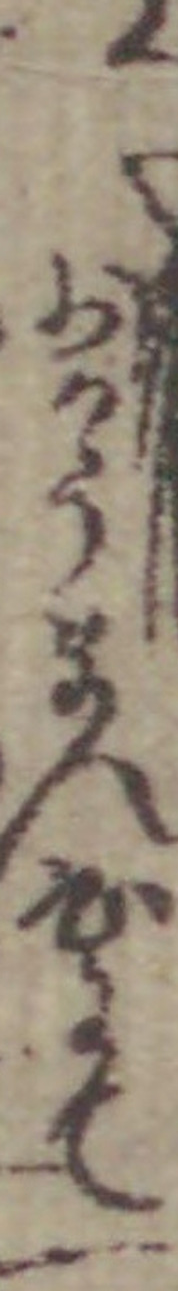少かうまん心にて
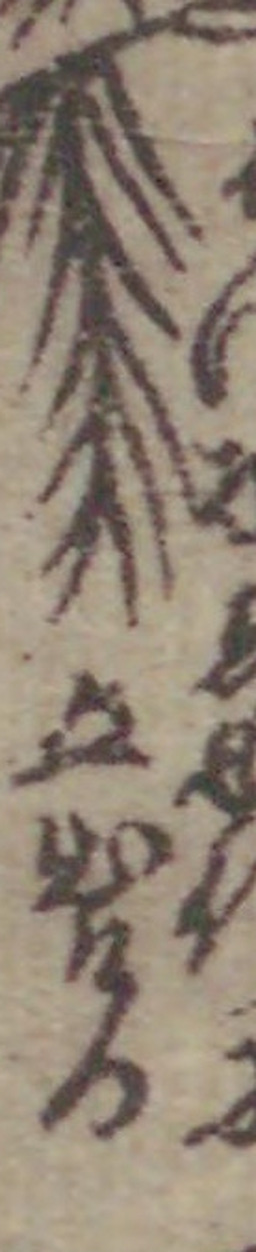立出ける

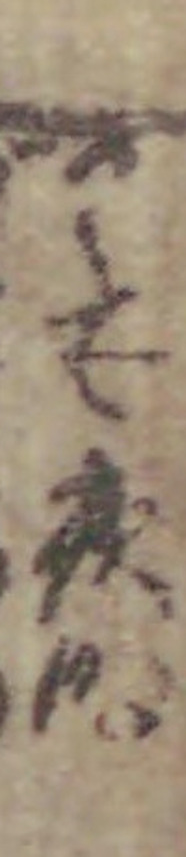かくて夜明
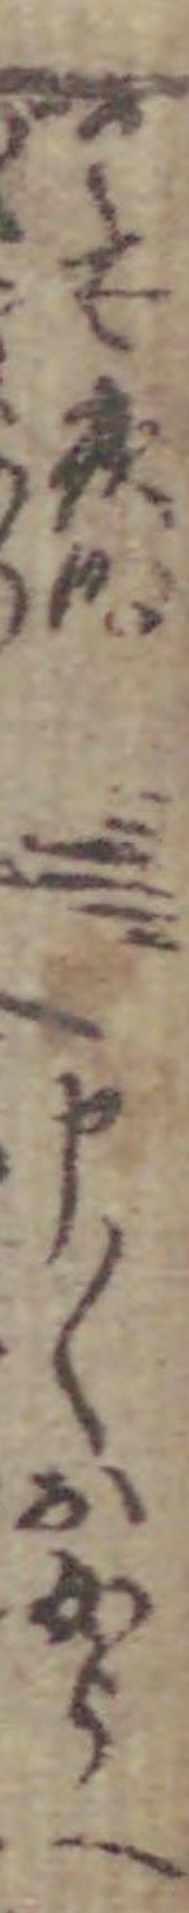かくて夜明
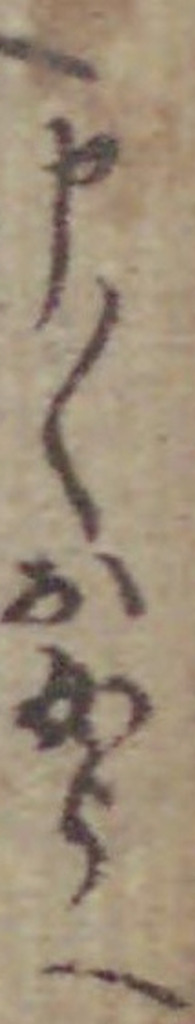申し〳〵お女郎
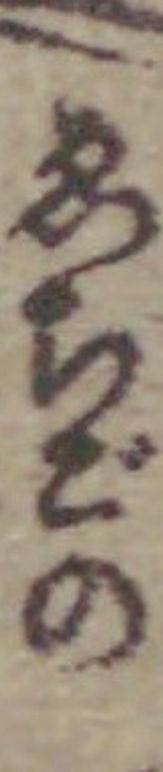ゑちごの
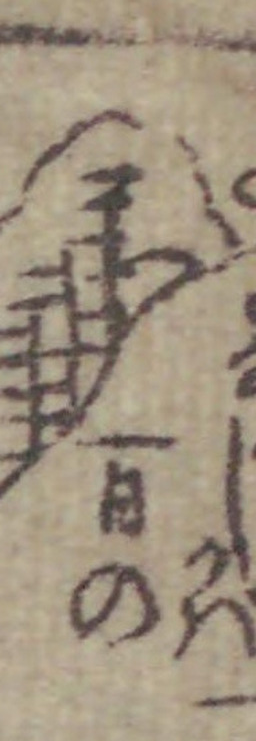一日の
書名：妖怪雪濃段 2巻
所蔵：国立国会図書館 National Diet Library, JAPAN
